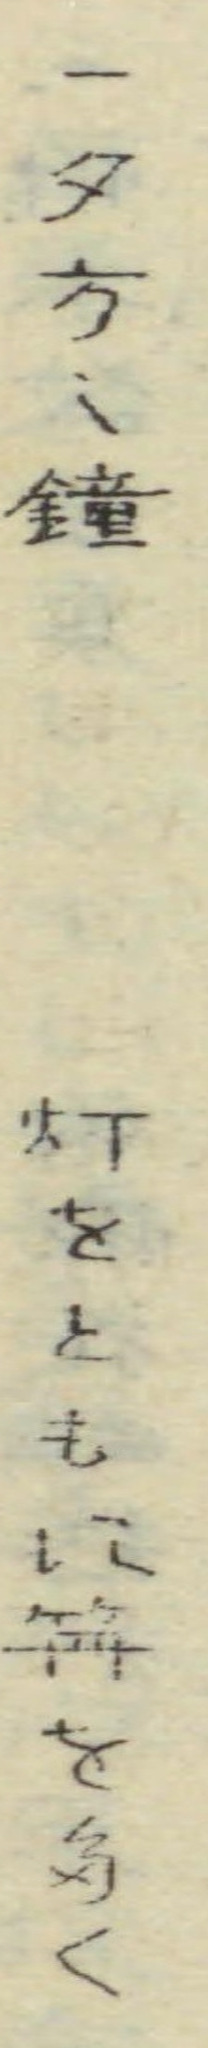一夕方之鐘灯をともに篝をたく
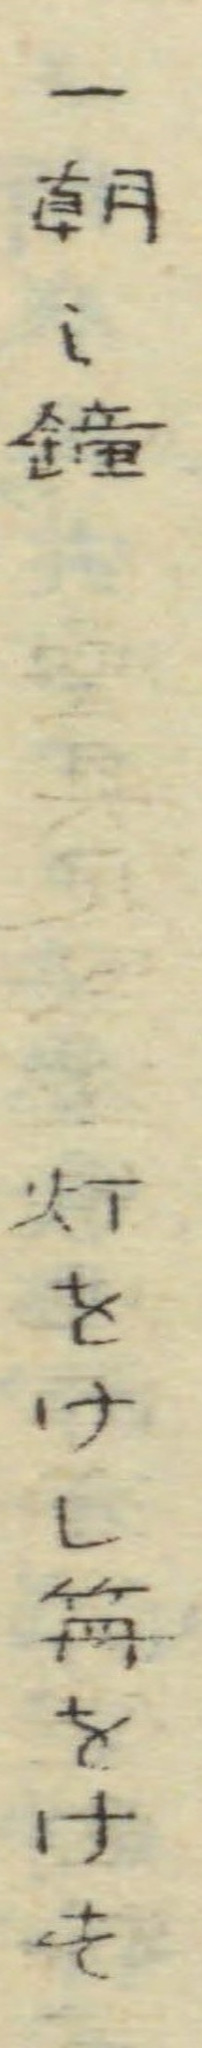一朝之鐘灯をけし篝をけす

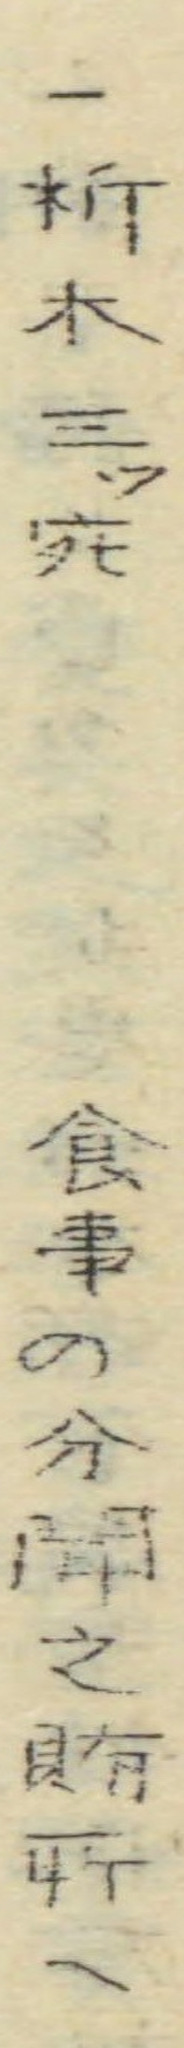一折木三ッ宛食事の分聞之賄所へ
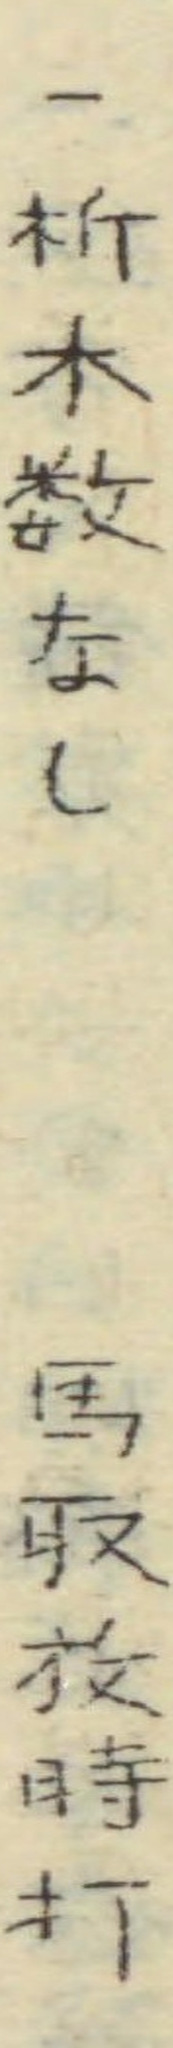一折木数なし馬取放時打
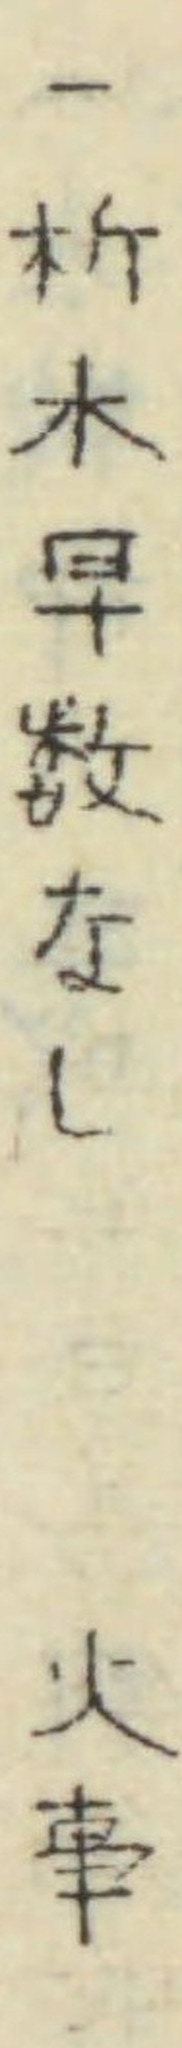一折木早数なし火事
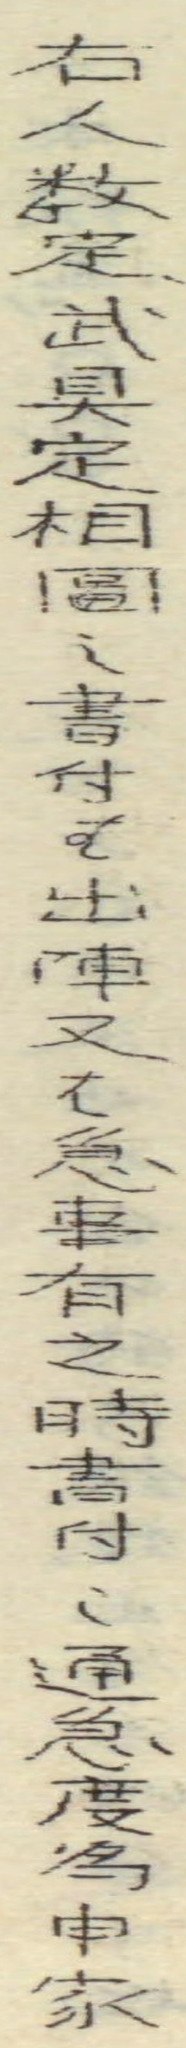右人数足武具定合圖之書付は出陣又は急事有之時書付之通急度為申家
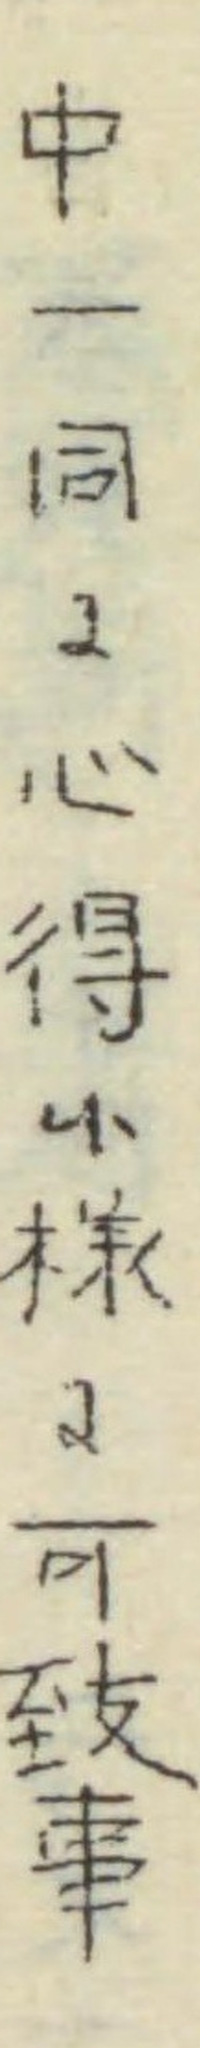中一同に心得候様に可致事
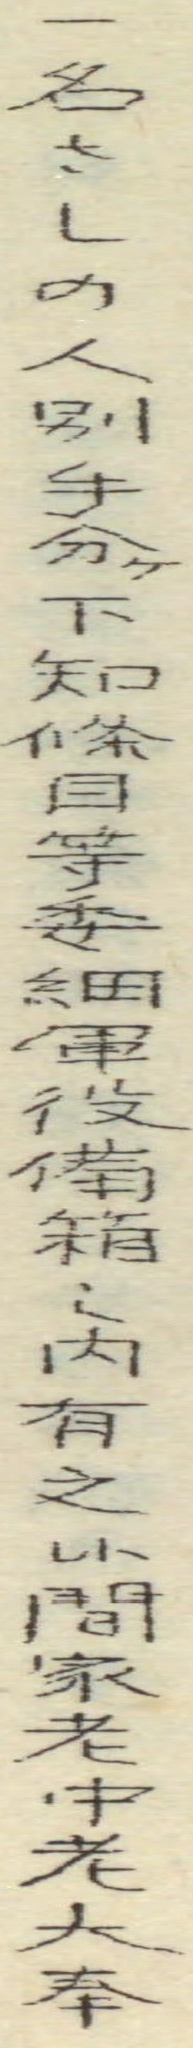一名さしの人別手分ヶ下知条目等委細軍役備箱之内有之候間家老中老大奉
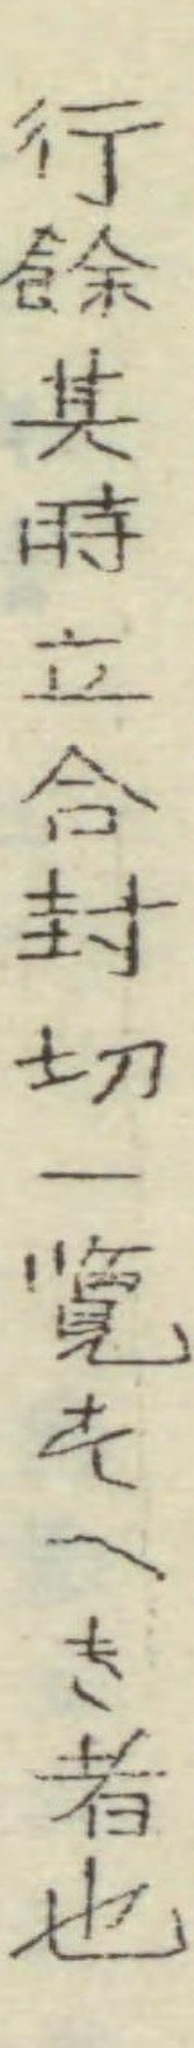行餘其時立合封切一覧すへき者也
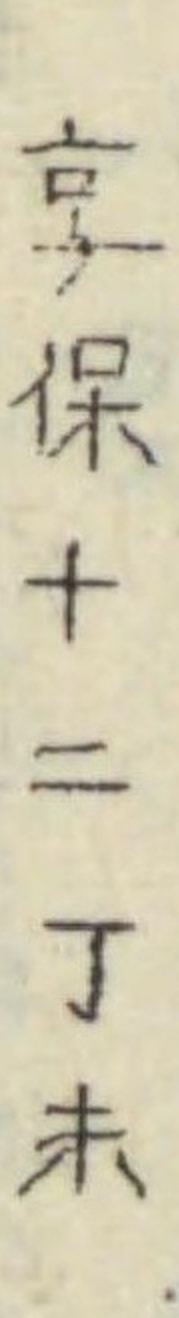享保十二丁未
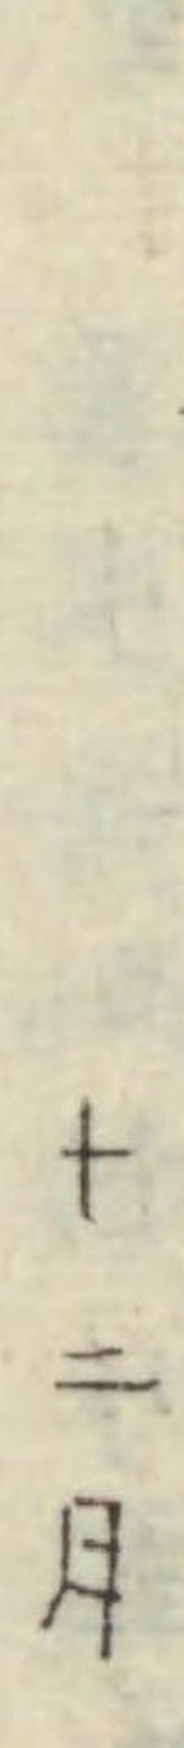十二月
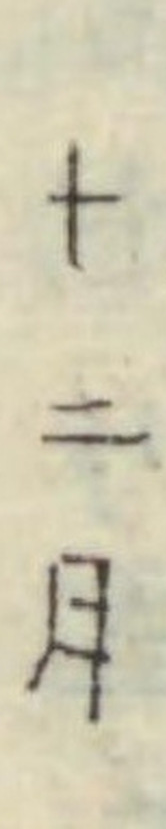十二月
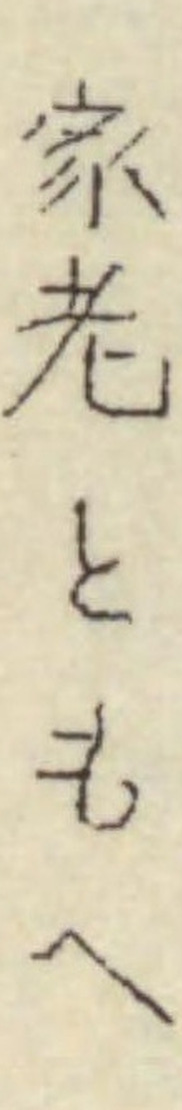家老ともへ
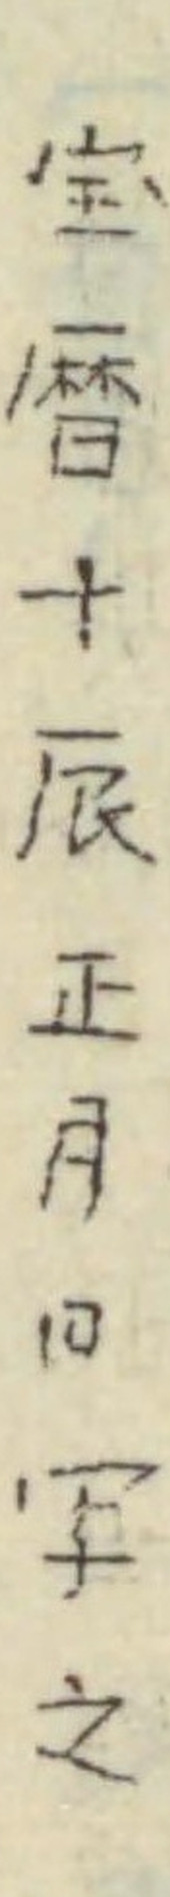宝暦十辰正月日写之
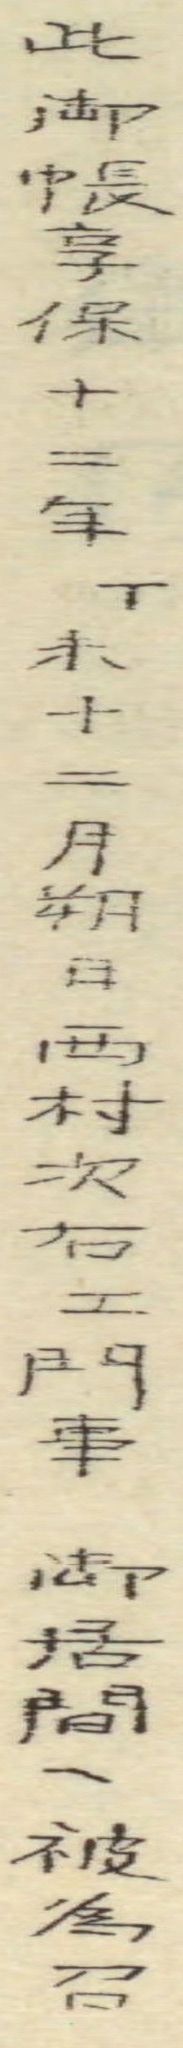此御帳享保十二年丁未十二月朔日西村次右エ門事御居間へ被為召
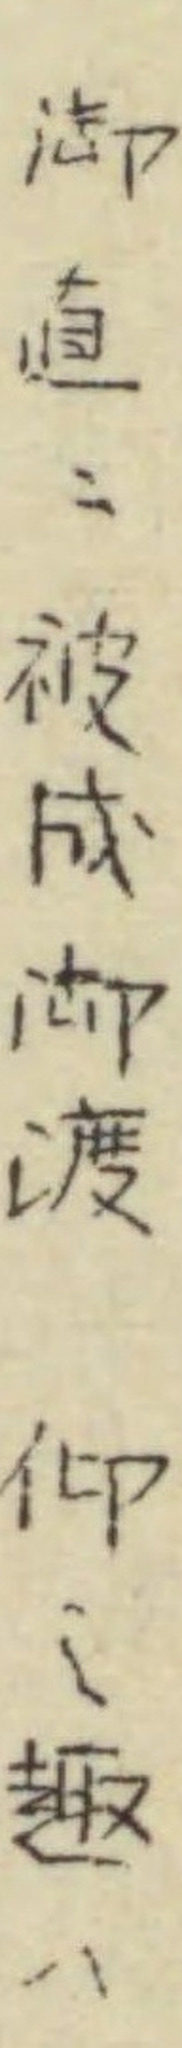御直二被成御渡仰之趣ハ
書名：三河吉田藩動員史料
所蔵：国立国会図書館 National Diet Library, JAPAN
